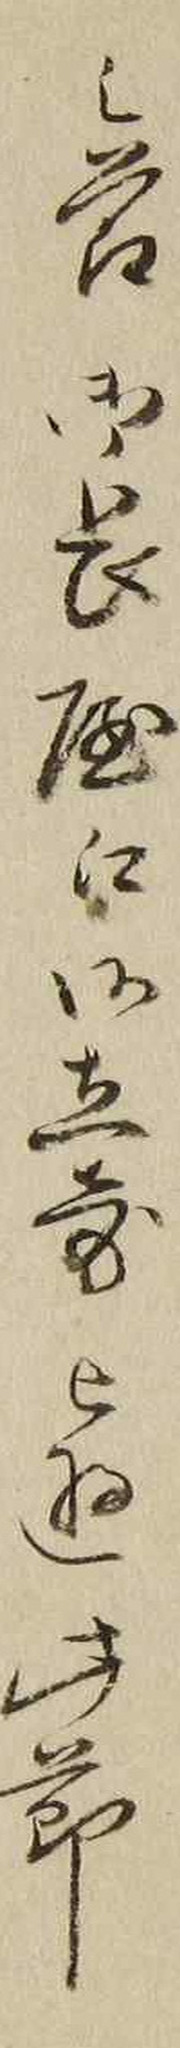之節御長屋江御立寄被遊此節
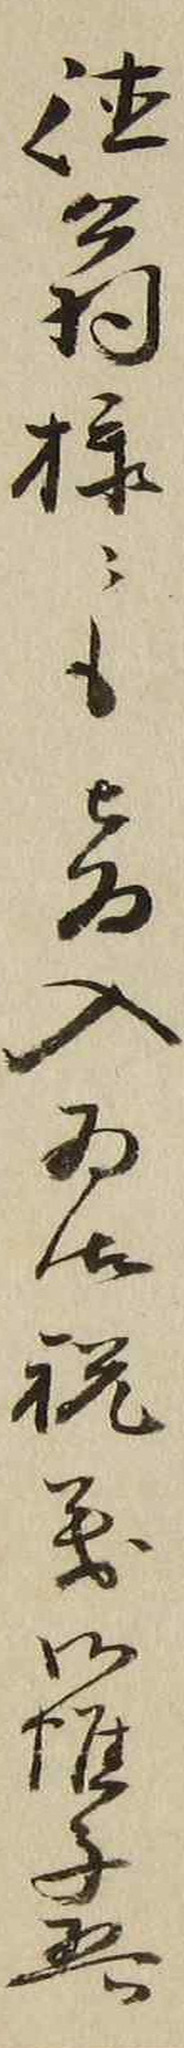徳翁様にも被為入為御祝義御帷子五つ
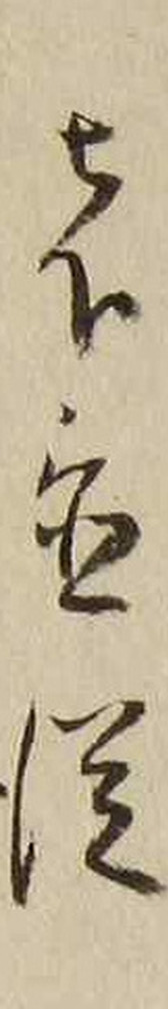被下置従
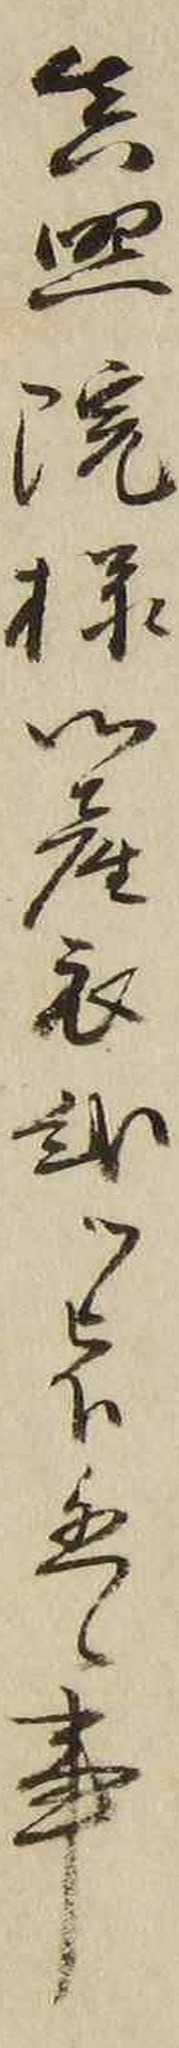真照院様御産衣弐つ被下置候事
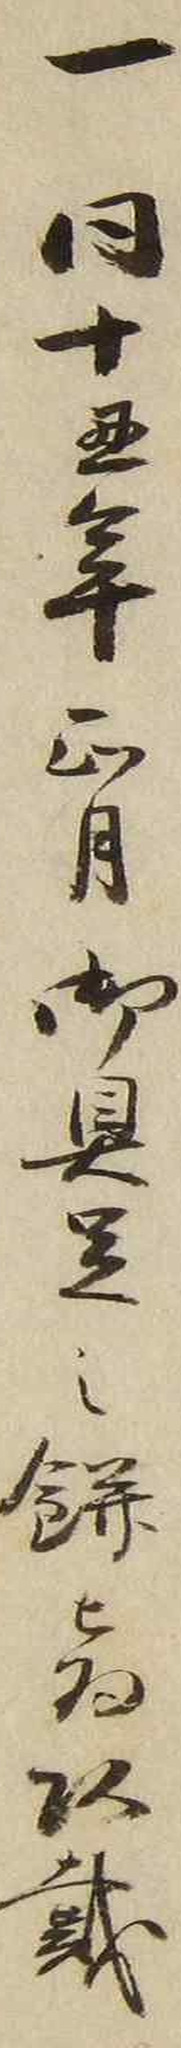一同十丑正月御具足之餅被為頂戴

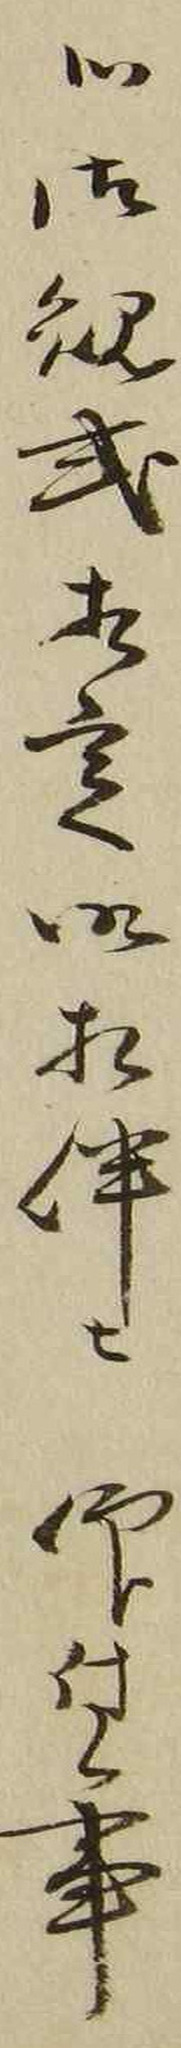以御規式相定御相伴被仰付候事
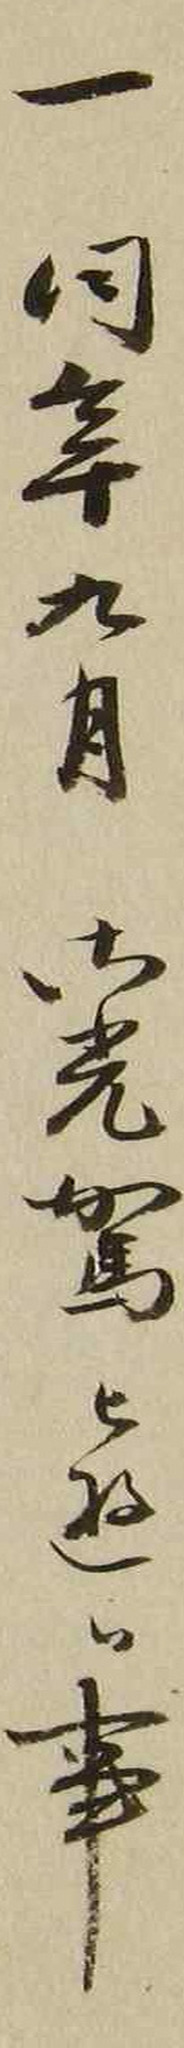一同年九月御光駕被遊候事
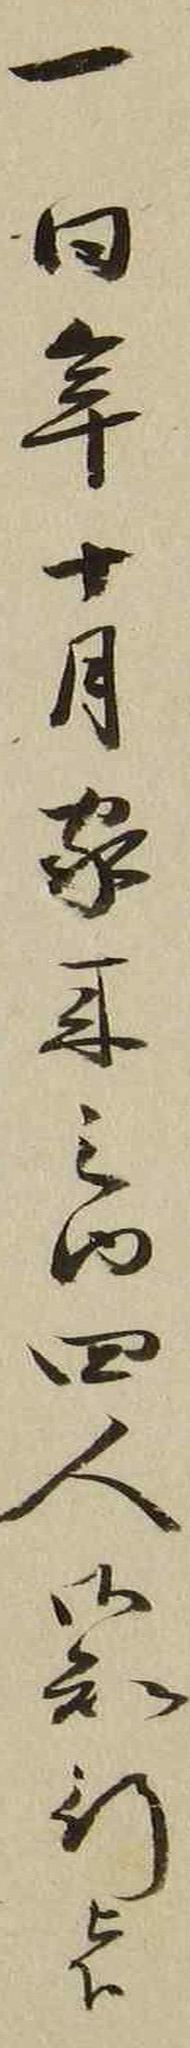一同年十月家来之内四人御知行被下
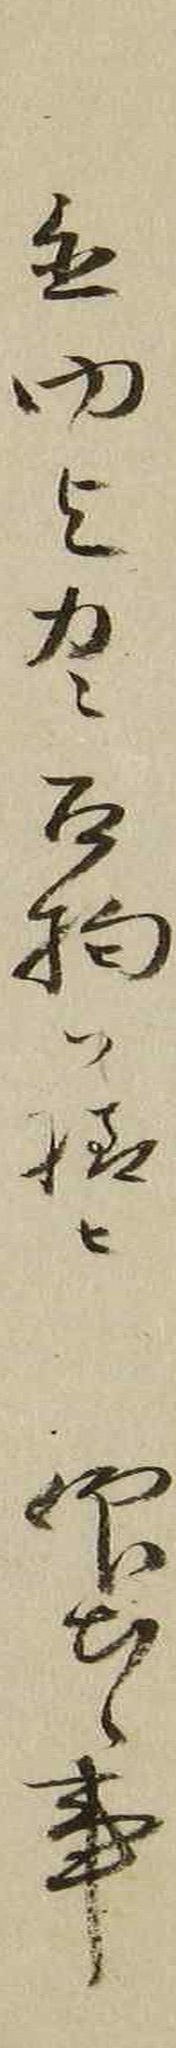置内与力に召抱候様被仰出候事
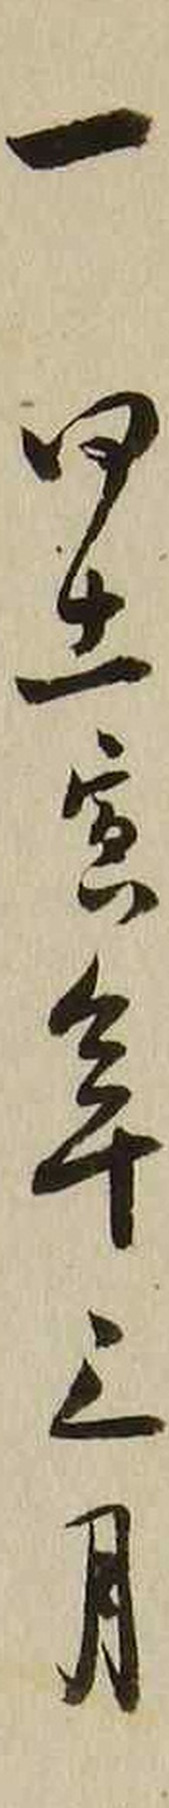一同十一寅年三月
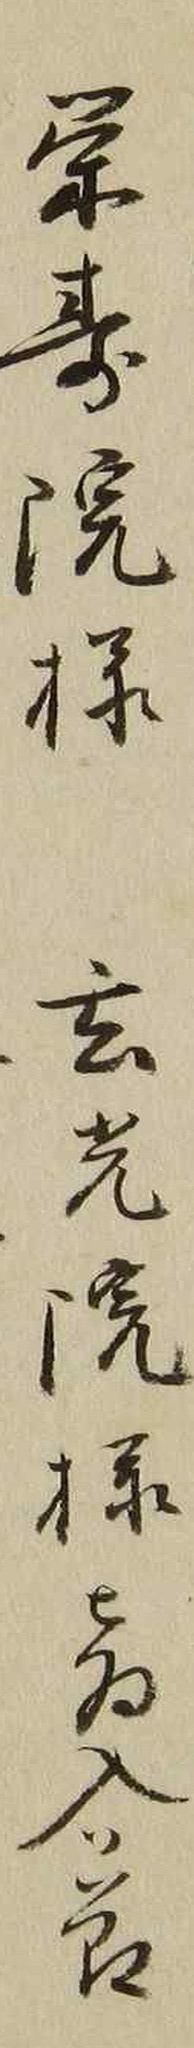栄寿院様玄光院様被為入候節
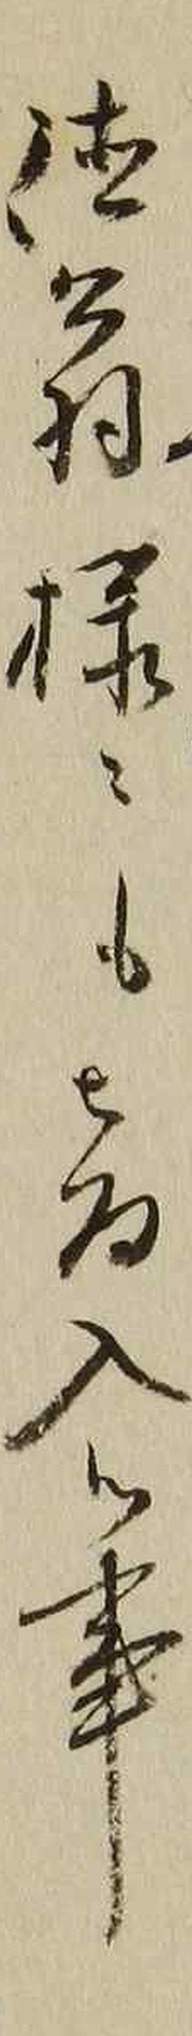徳翁様にも被為入候事
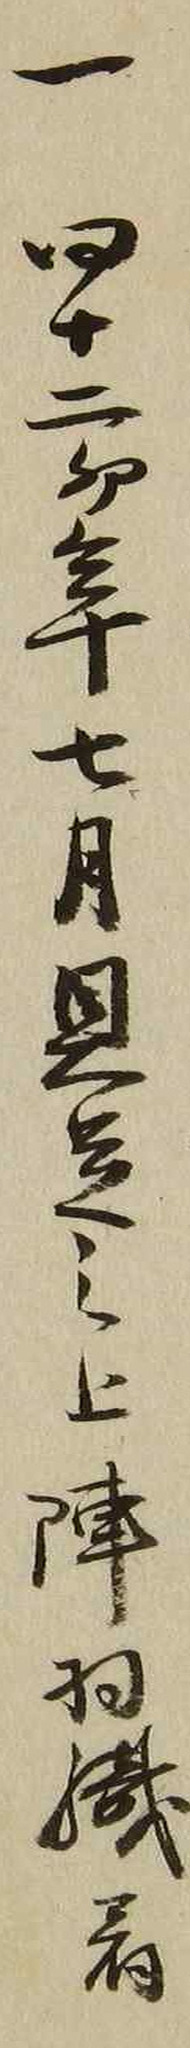一同十二卯年七月具足之上陣羽織着
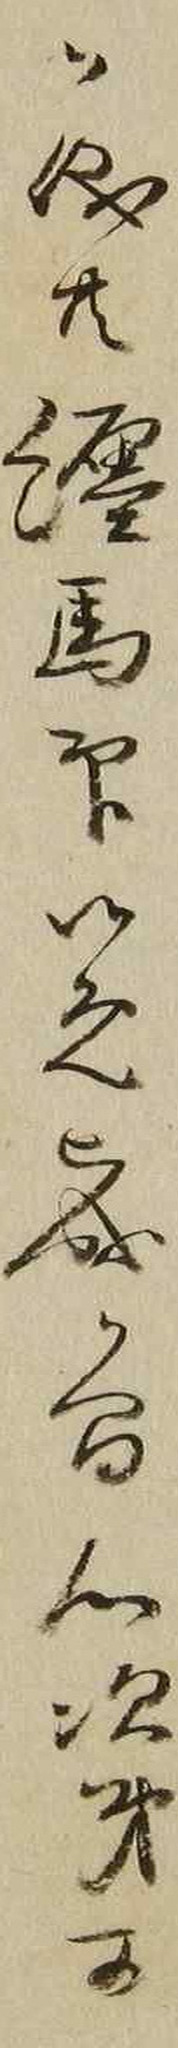候儀共纒馬印御免被成候間心次第可
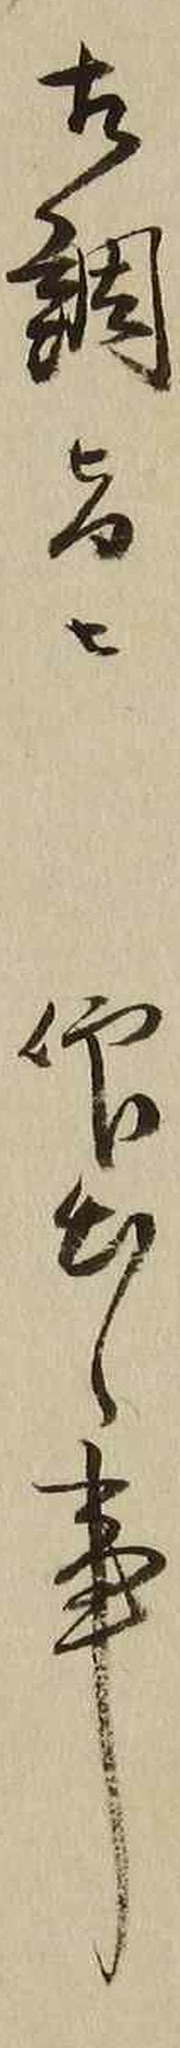相調旨被仰出候事
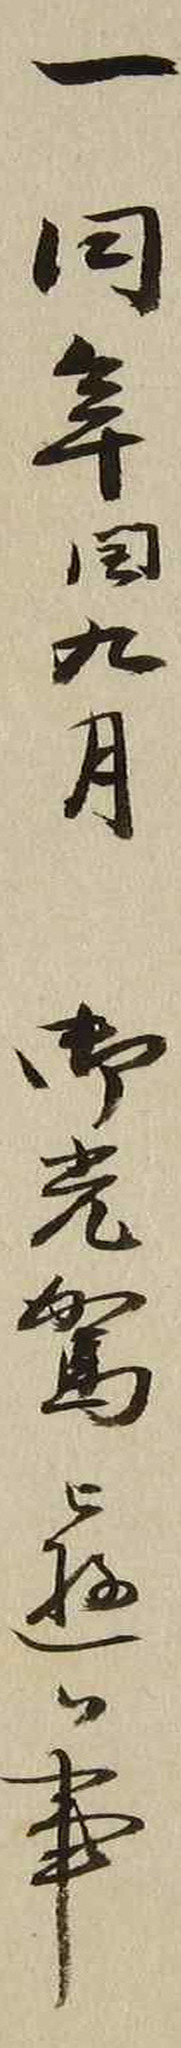一同年九月御光駕被遊候事
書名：諸士系譜　巻之269　さ之部1
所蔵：会津若松市立会津図書館
